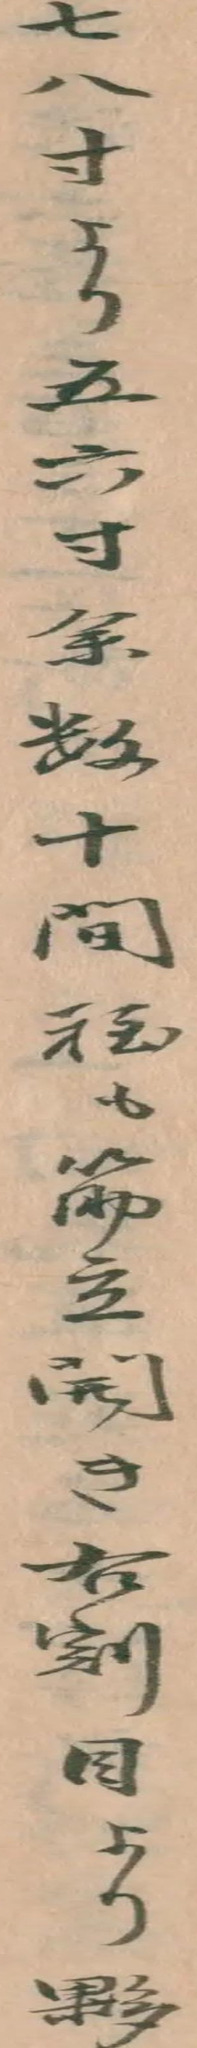七八寸より五六寸余数十間程も筋立開き右割目より夥
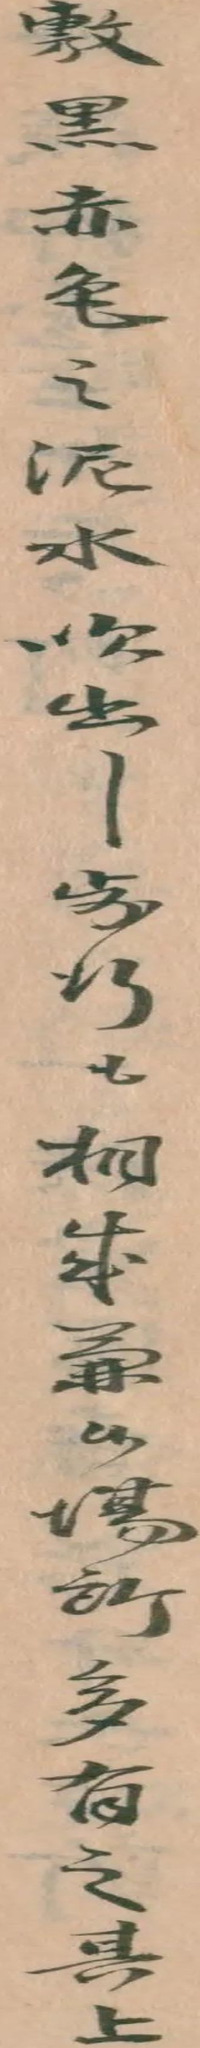敷黒赤色之泥水吹出し歩行も相成兼候場所多有之其上
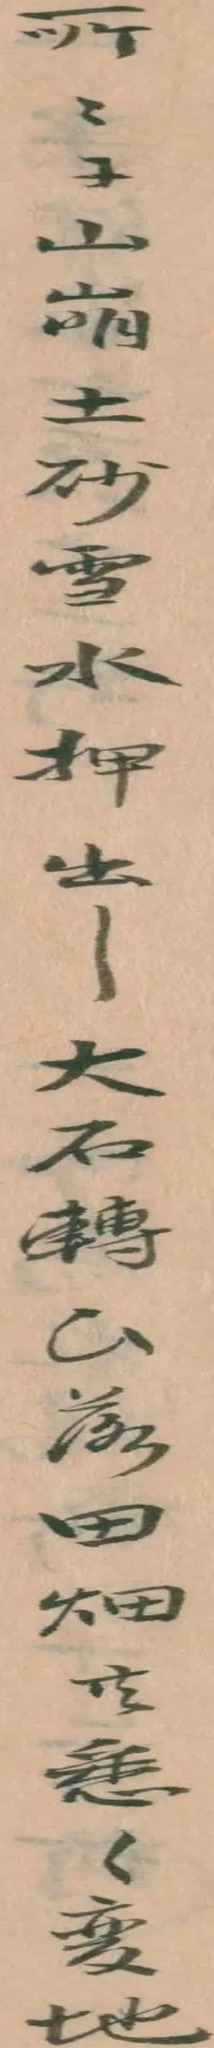所々に山崩土砂雪水押出し大石転ひ落田畑共悉く変地
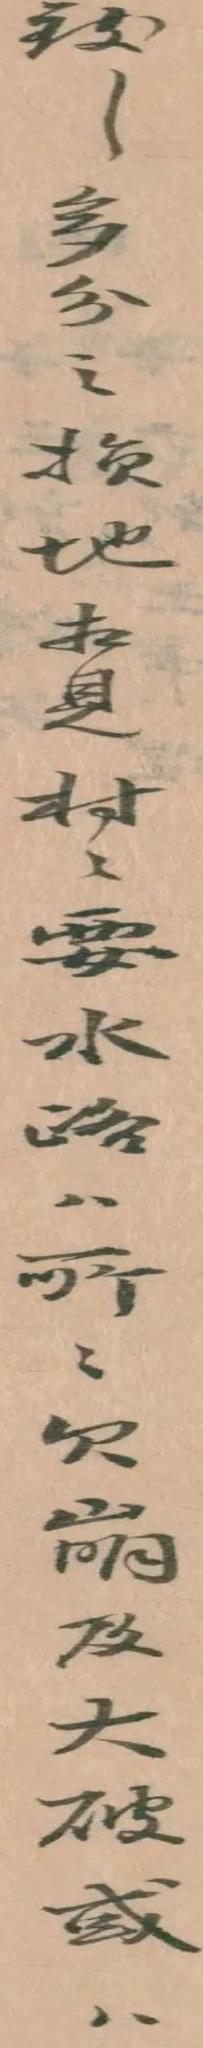致し多分之損地相見村々要水路ハ所々欠落及大破或ハ
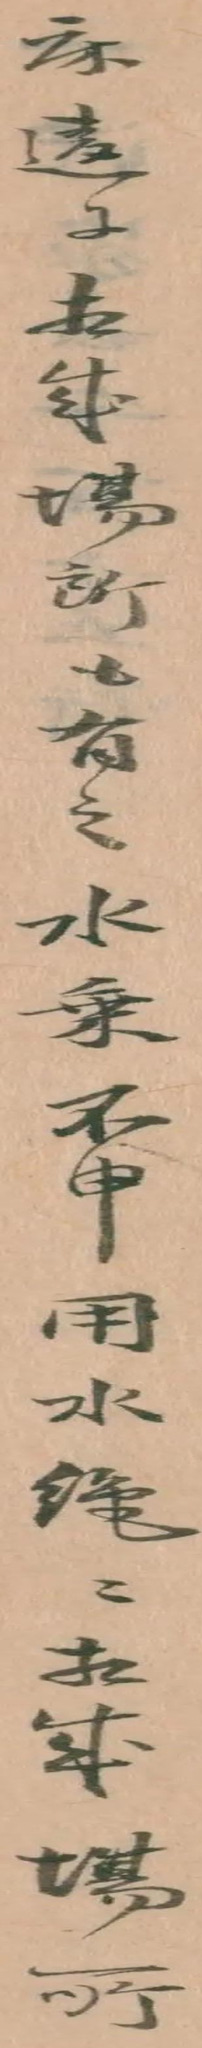床違に相成場所も有之水乗不申用水絶ニ相成場所
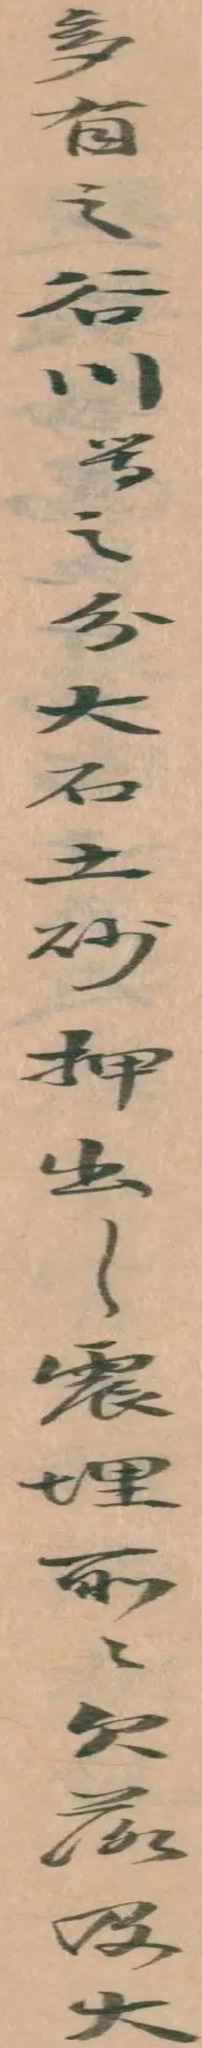多有之谷川等之分大石土砂押出し震埋所々欠落及大
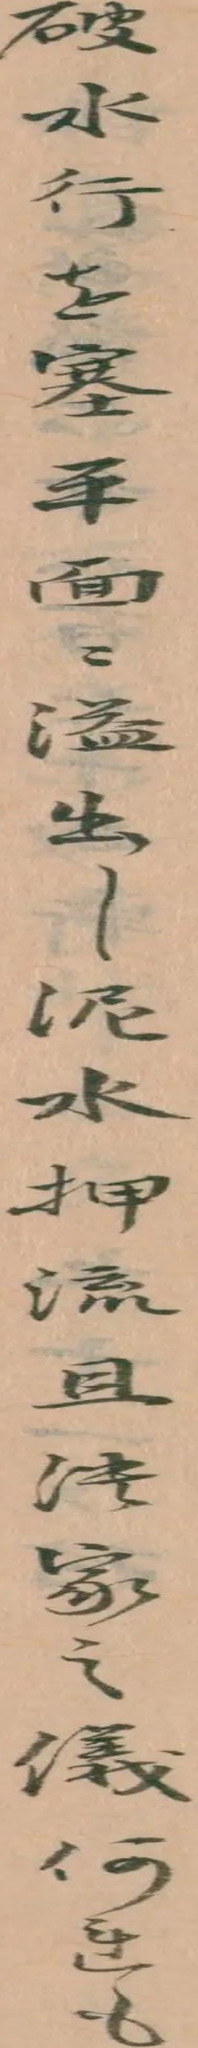破水行を塞平面ニ溢出し泥水押流且潰家之儀何れも
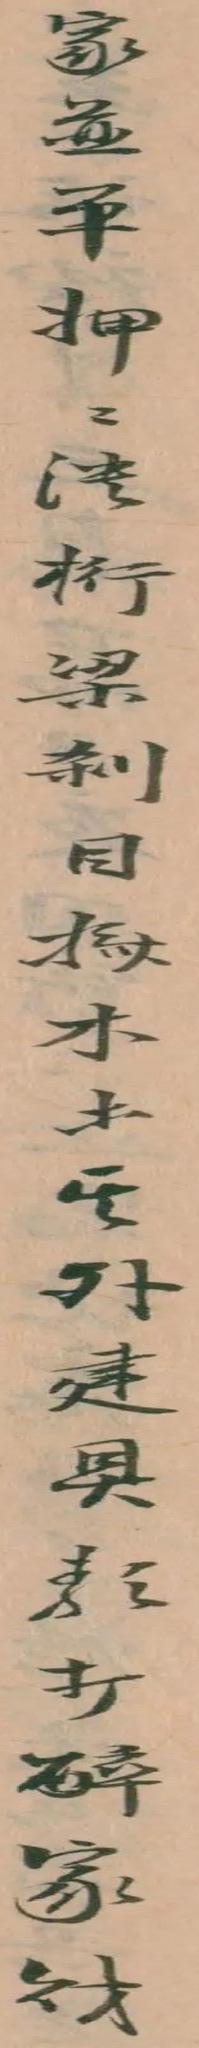家並平押ニ潰桁梁矧目臍木等其外建具類打砕家財
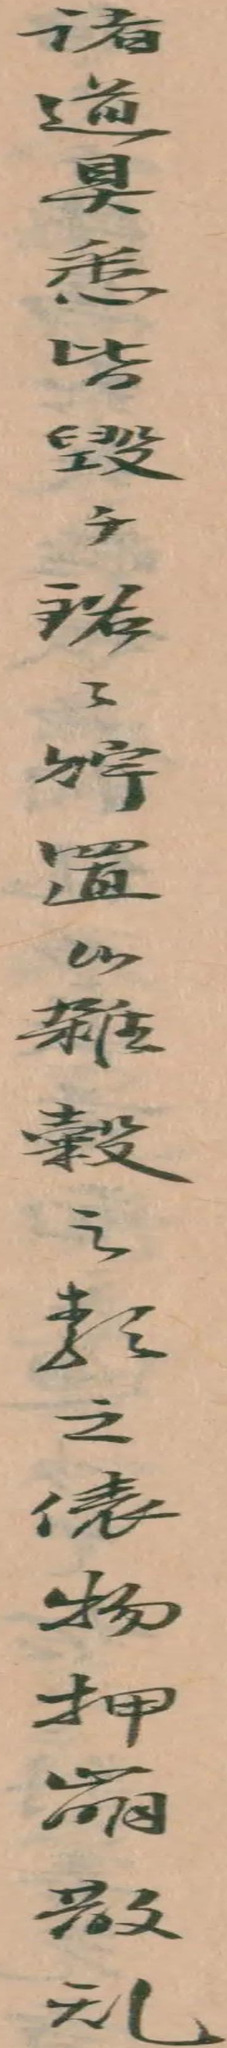諸道具悉皆打毀銘々貯置候雑穀之類之俵物押崩散乱
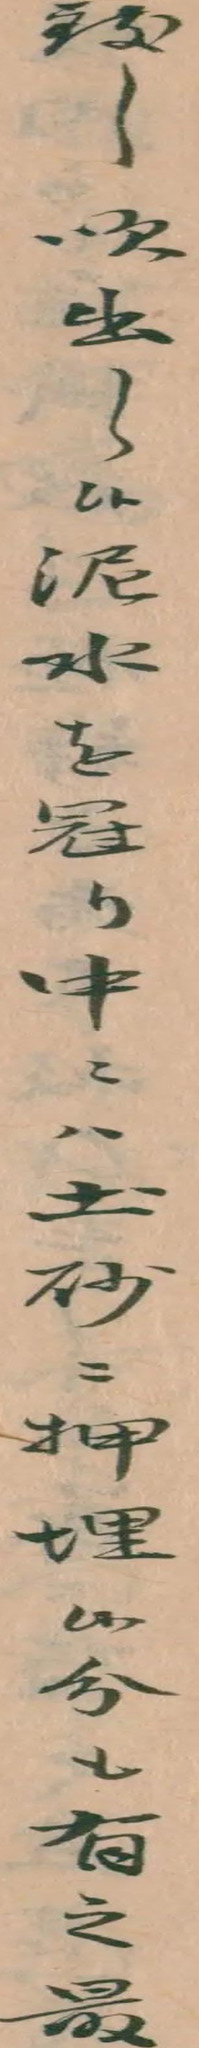致し吹出し候泥水を冠り中二ハ土砂二押埋候分も有之最
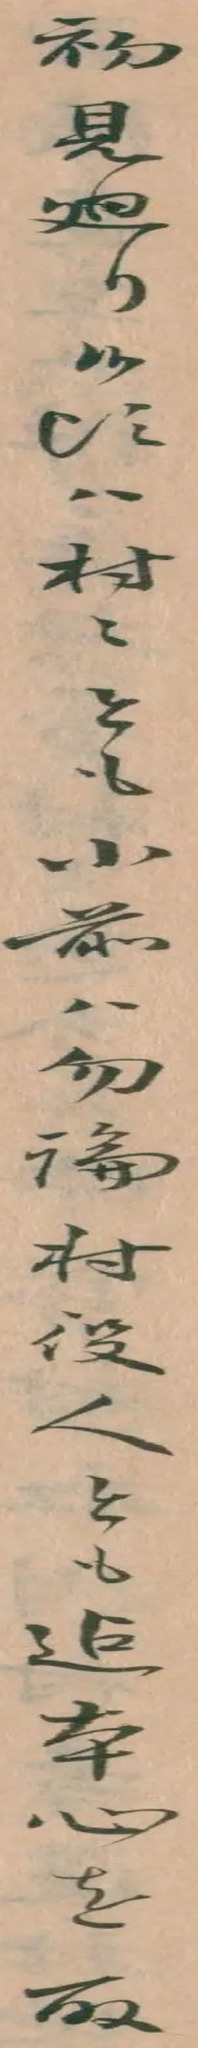初見廻り候頃ハ村々とも小前ハ勿論村役人とも迄本心を取
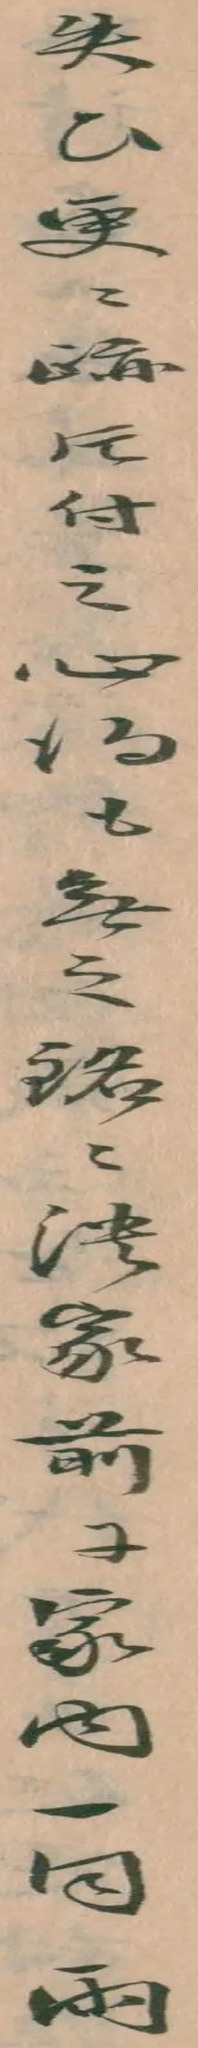失ひ更ニ跡片付之心得も無之銘々潰家前ニ家内一同雨
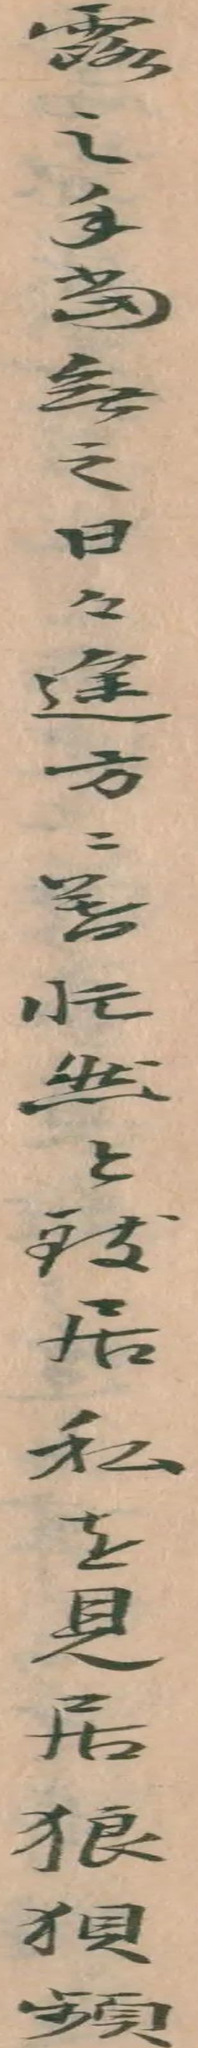露之手当無之日々途方ニ暮忙然と致居私を見居狼狽頻
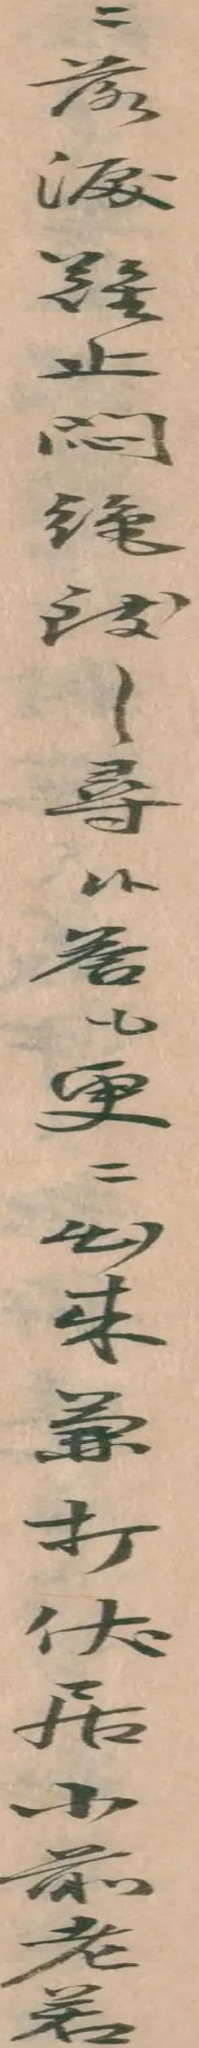二落涙難止悶絶致し尋候答も更二出来兼打伏居小前老若
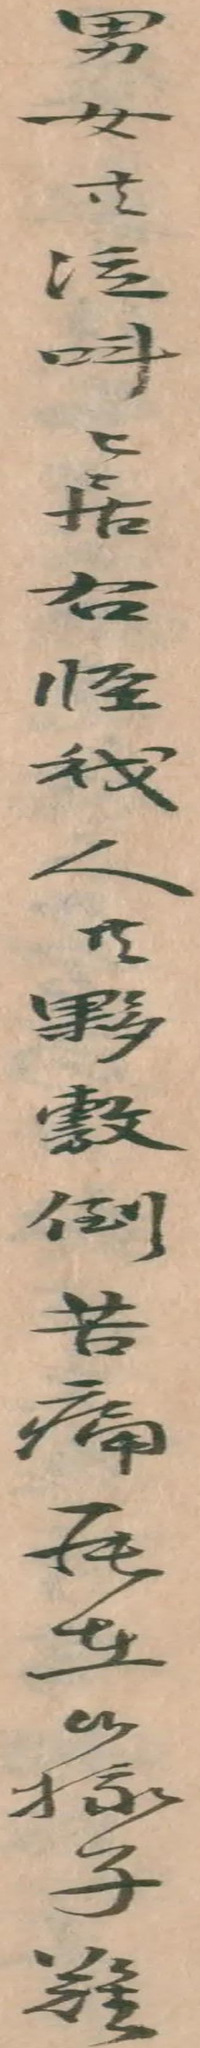男女共泣叫ひ居右怪我人共夥敷倒苦痛罷在候様子難
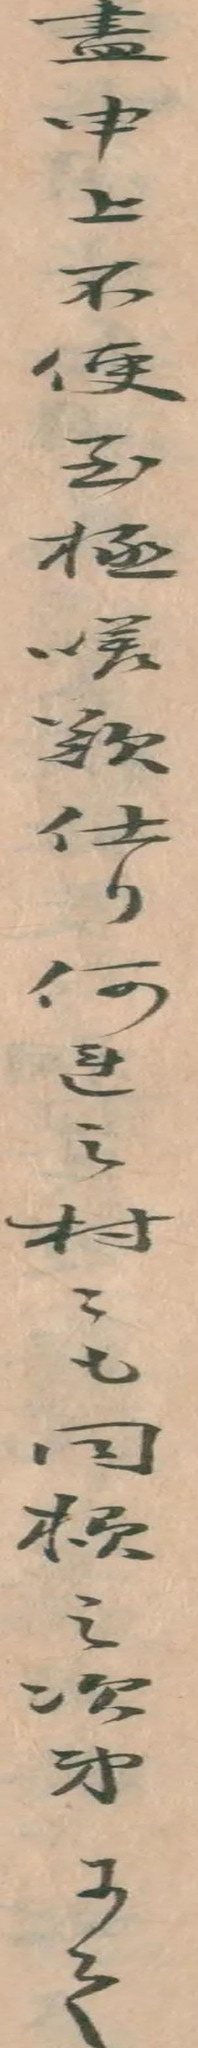尽申上不便至極嗟歎仕り何れ之村々も同様之次第にて
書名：地災撮要. 巻3(地震之部)-巻4(噴火之部)
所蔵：国立国会図書館 National Diet Library, JAPAN
